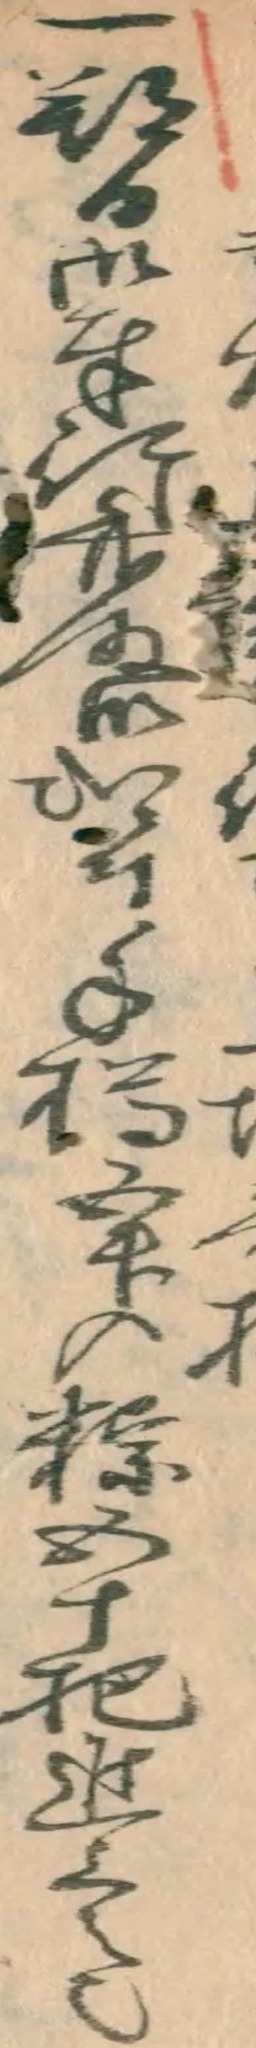一朔日御奉行弁殿御出ニ付手樽五升入粽五十把進上之也
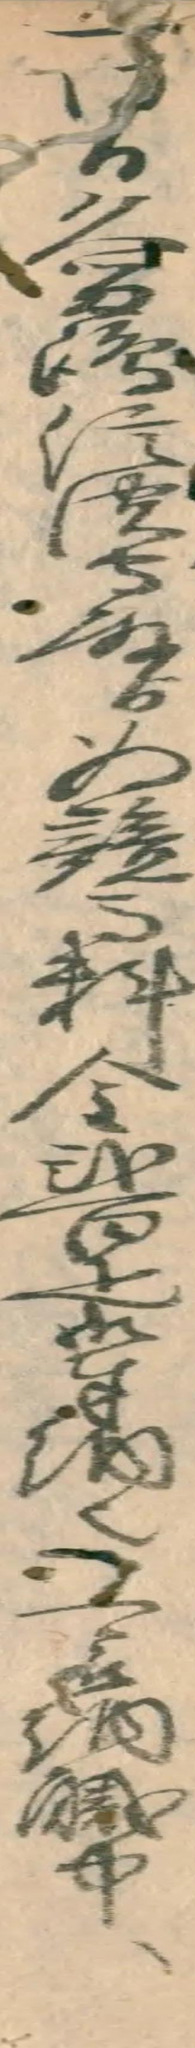一同日久留嶋信濃守殿ゟ為競馬料金弐百疋御奉納也可被納職中へ
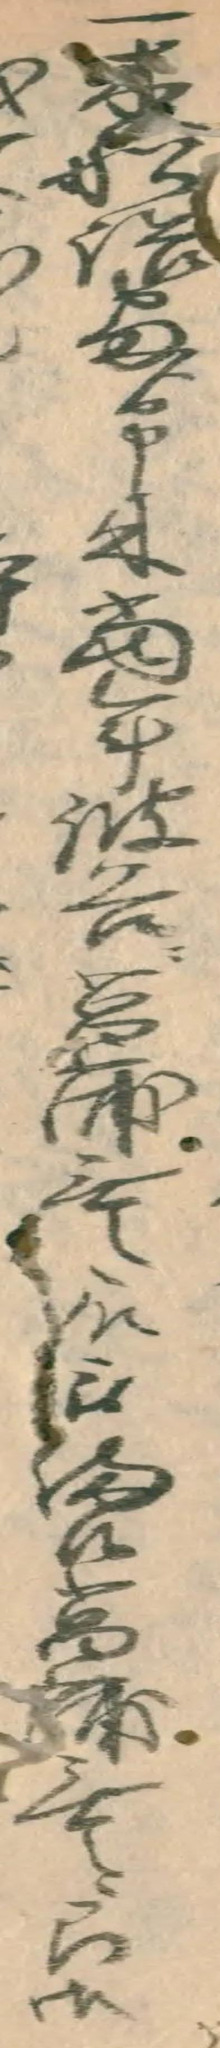一木船詰番ゟ申来当年彼谷ニ菖蒲無之候故被帰候菖蒲無之候間御
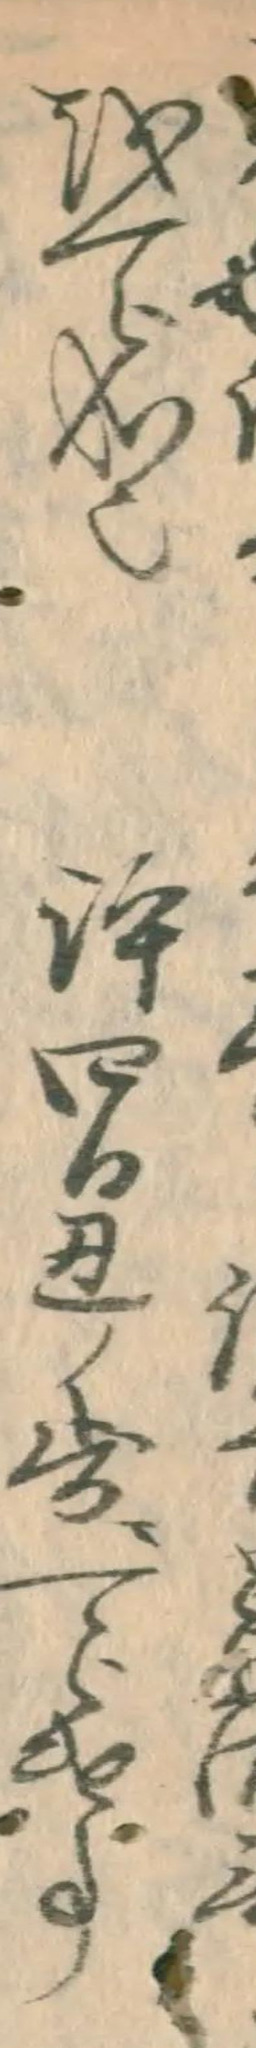越可被成也評四日丑ノ歩ニ可被遣事
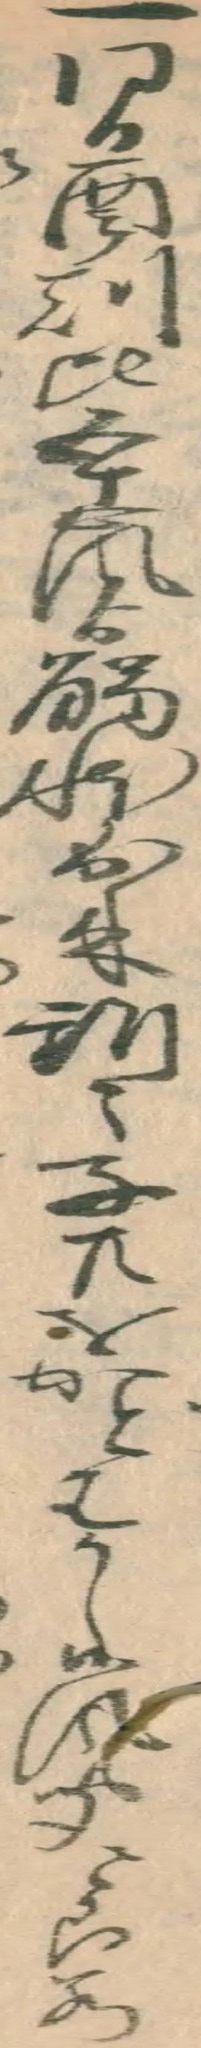一同日酉刻比五十風ゟ触状到来所々子共をかどはかし候風聞ニ候間若
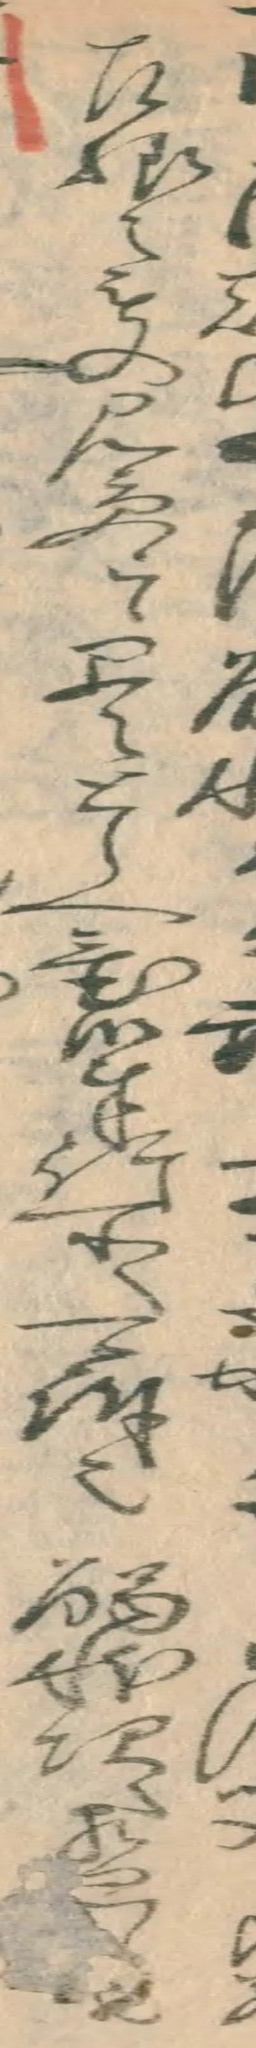左様之もの見受候ハヽ早々とらへ置候奉行所へ可付也触状次へ相廻候也
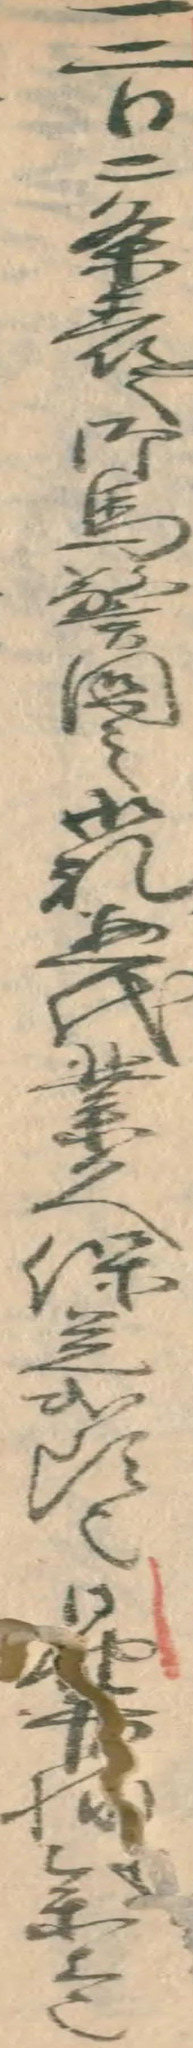一二日二条表へ御馬警固之御礼惣代業久保覚出頭也日野弁様も参上也
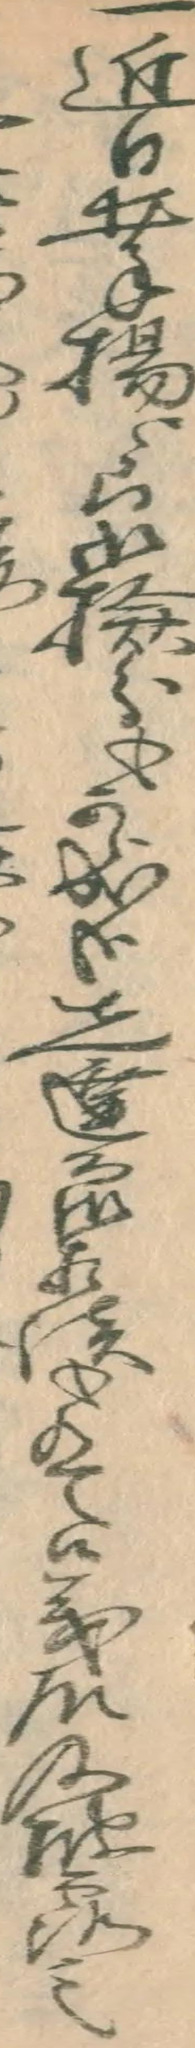一近日井手揚ニ候間御検分も可被成哉先達而御相談も有之候義故及披露也
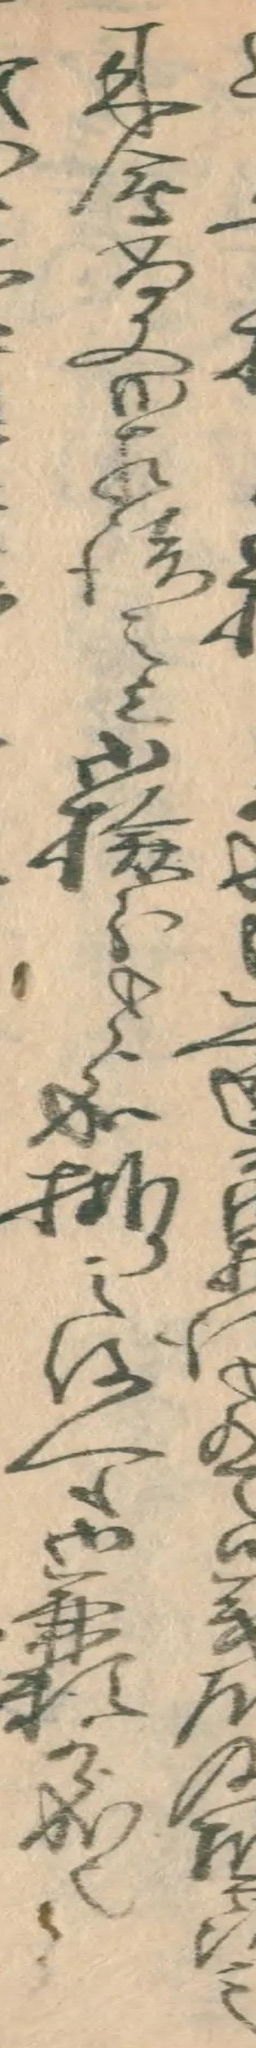来会尚又御相談之上御検分も被成掛り之役人も御兼頼可被成也
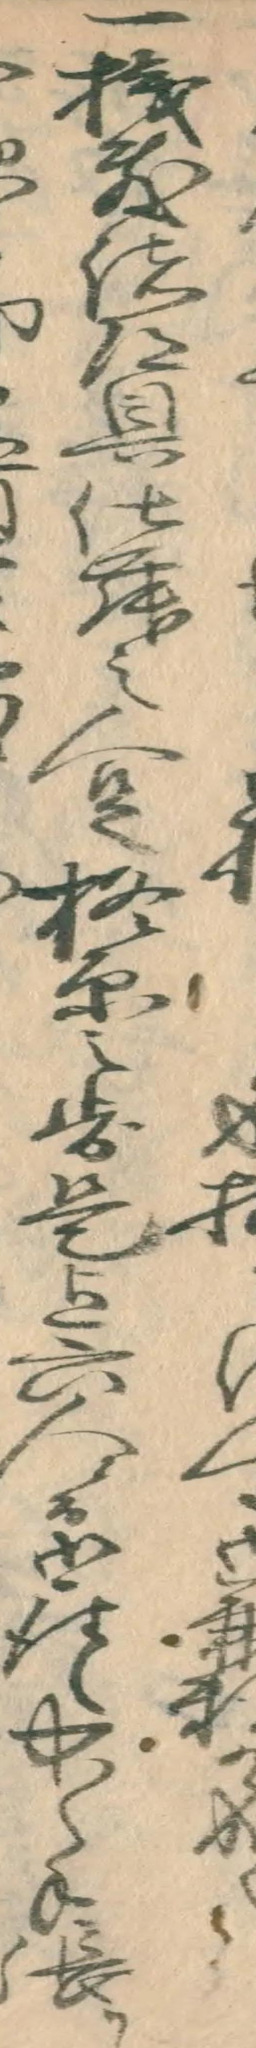一桟敷諸道具仕舞之人足柊原之歩是迄六人ニ而御座候中〳〵手ニ張り
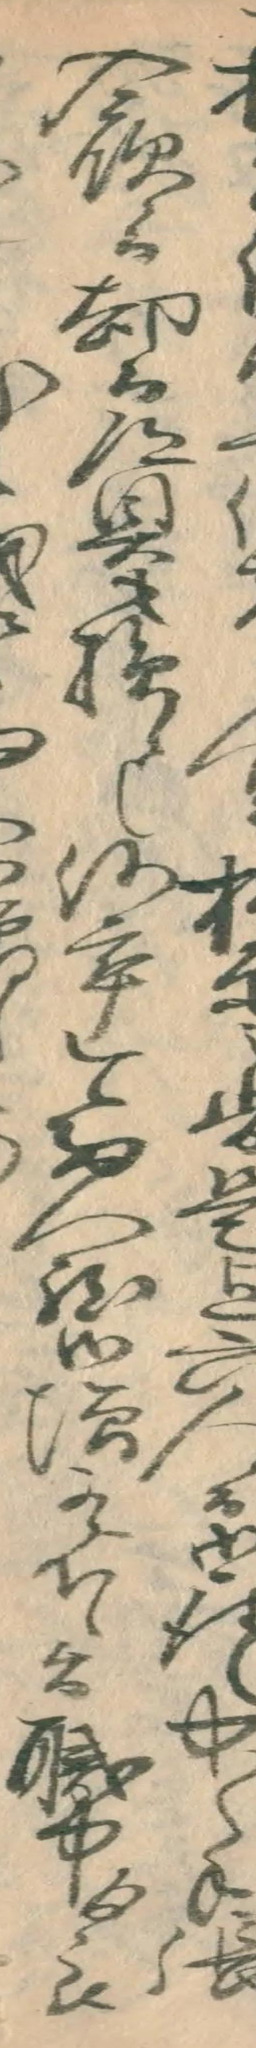入夜ニ而却而道具も損し申候何卒今両人程御増可被下候旨職中ゟ被
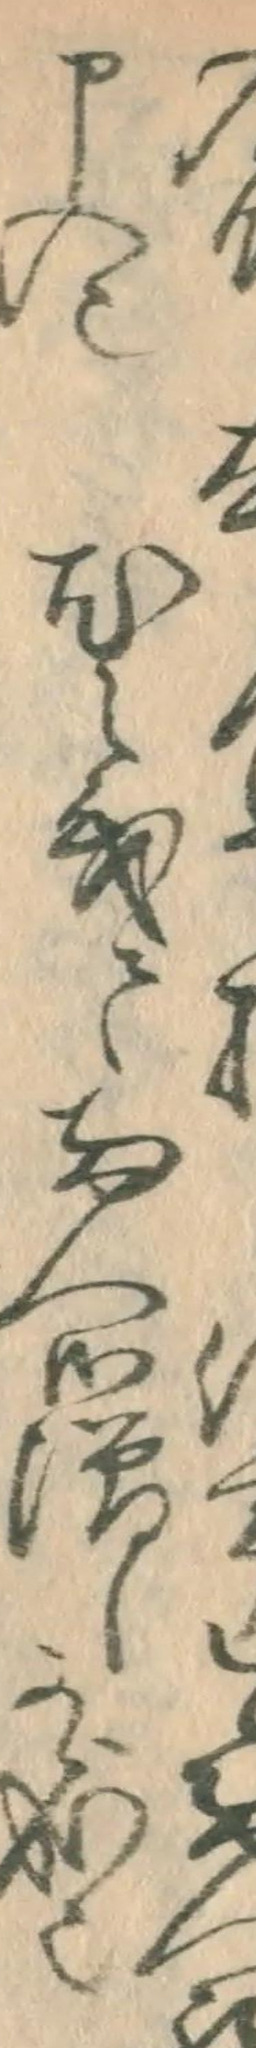申入也尤之義ニ候両人御増し可被成也
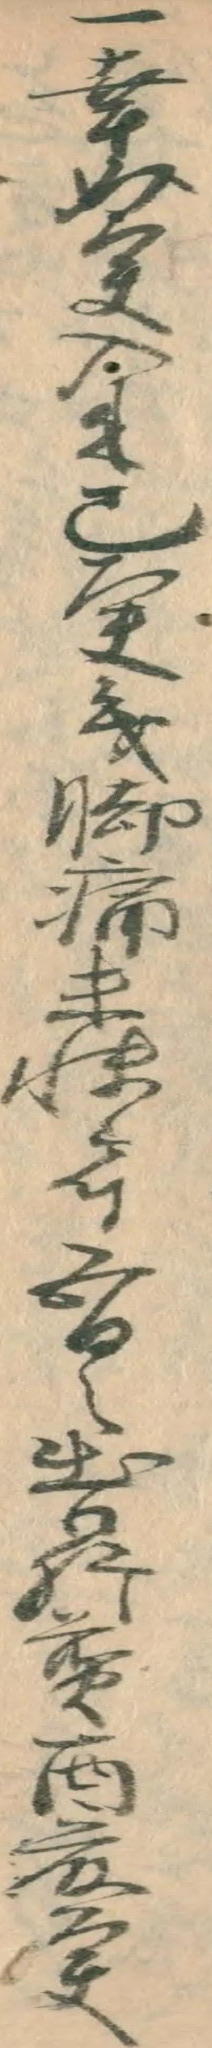一幸大夫入来巳大夫義脚痛未快候ニ付五日之出口肝煎酉藤大夫
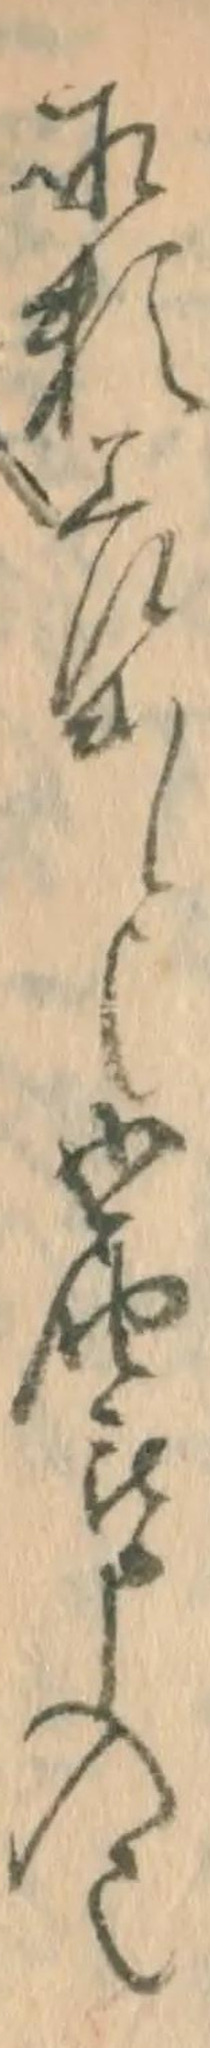相頼差出し申候御届被申入也

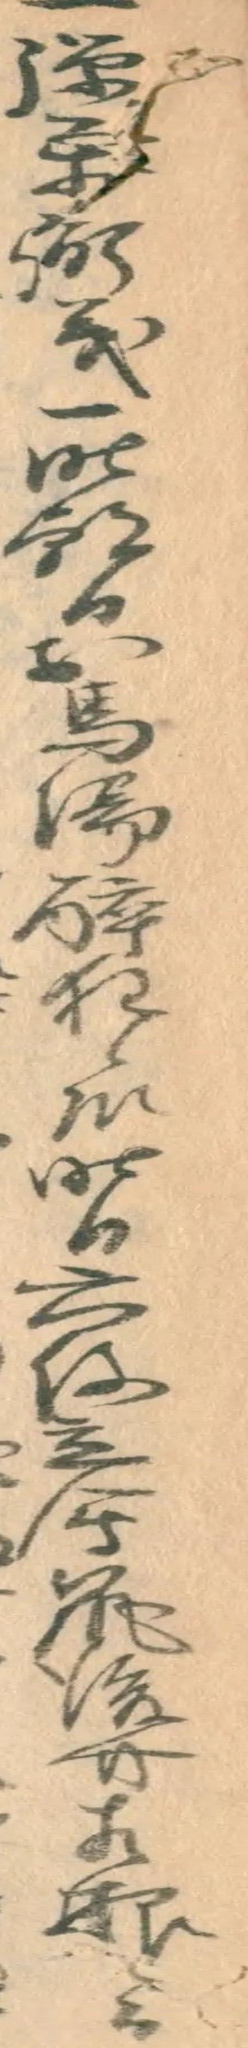一弾正少弼義一昨朔日於馬場酔狂候故昨日六役立会筑後介相招候而
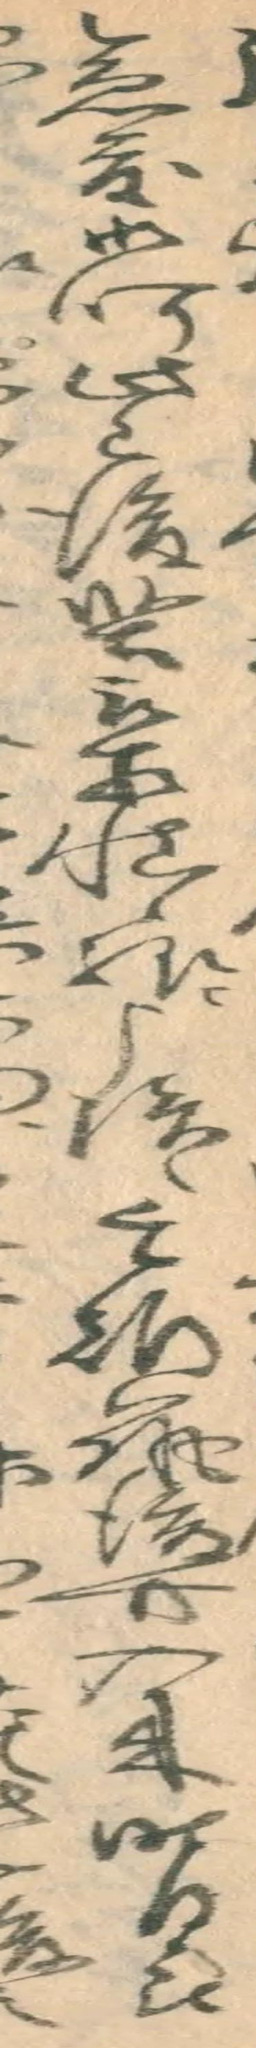急度御呵此已後堅被相慎候様ニ申談候今朝筑後介入来昨日被
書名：賀茂社記録. 第58冊
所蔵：国立国会図書館 National Diet Library, JAPAN
